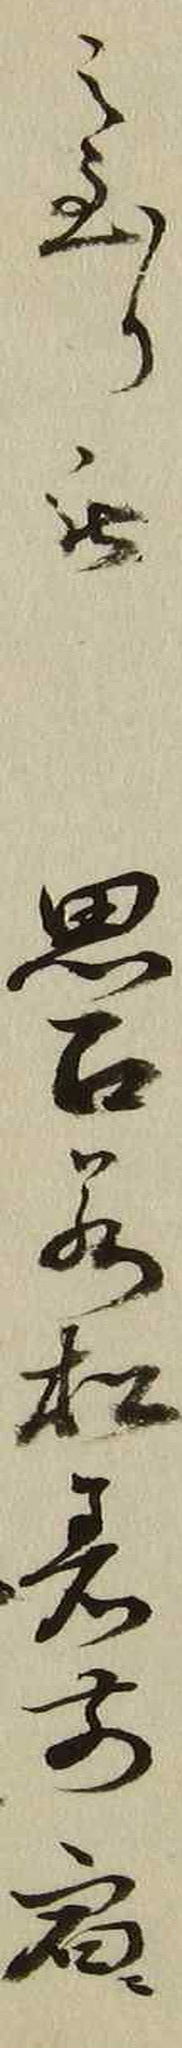之至り被思召若松着前宿ニ
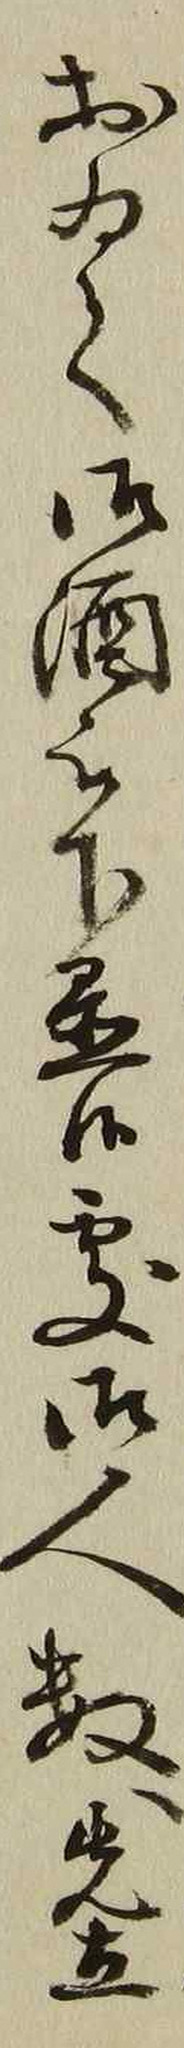おゐて御酒被下置候処御人数へ先立
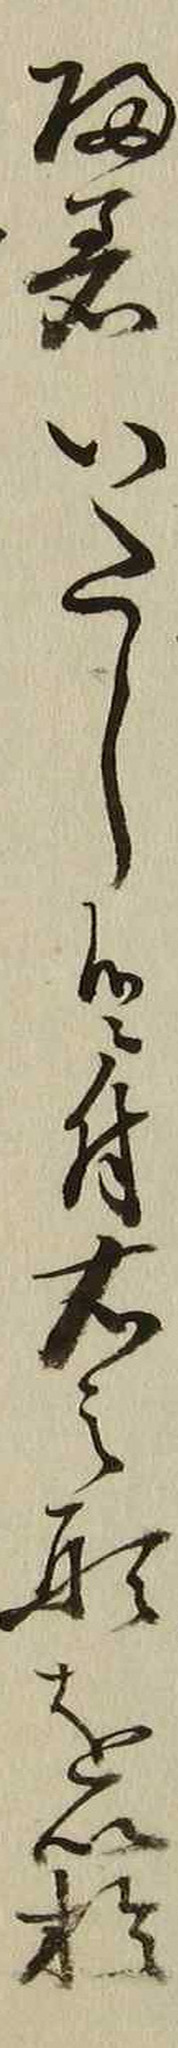帰着いたし候ニ付右之形を以於
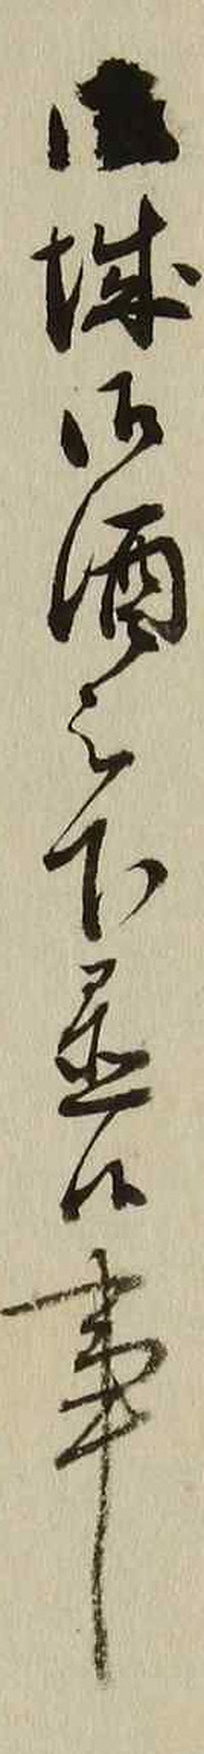御城御酒被下置候事
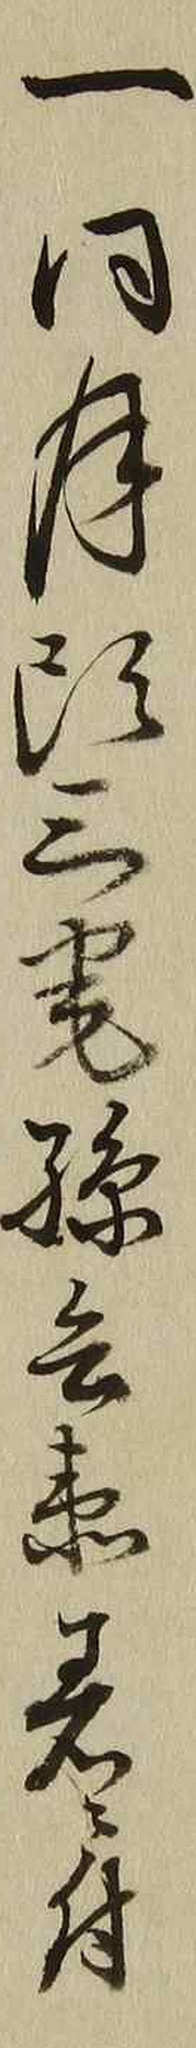一同月頭三宅孫兵衛着ニ付
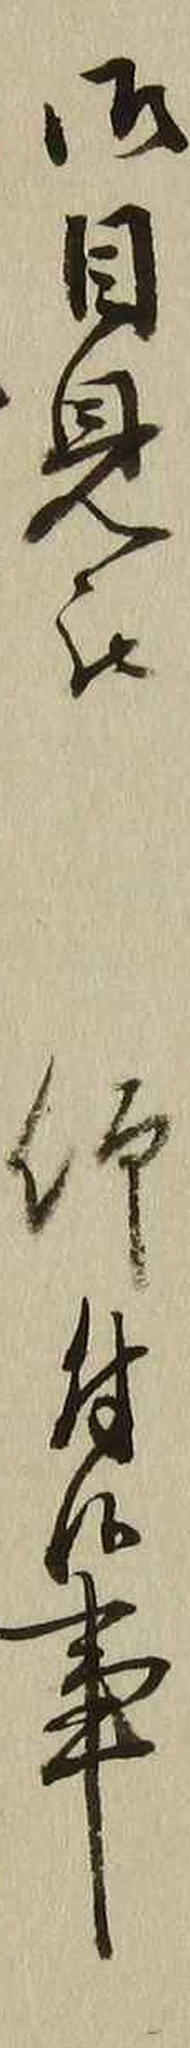御目見被仰付候事
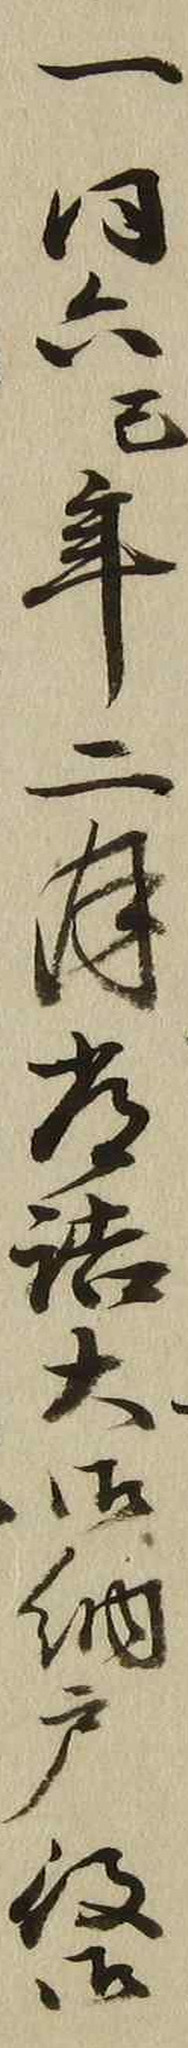一同六巳年二月常詰大御納戸役御
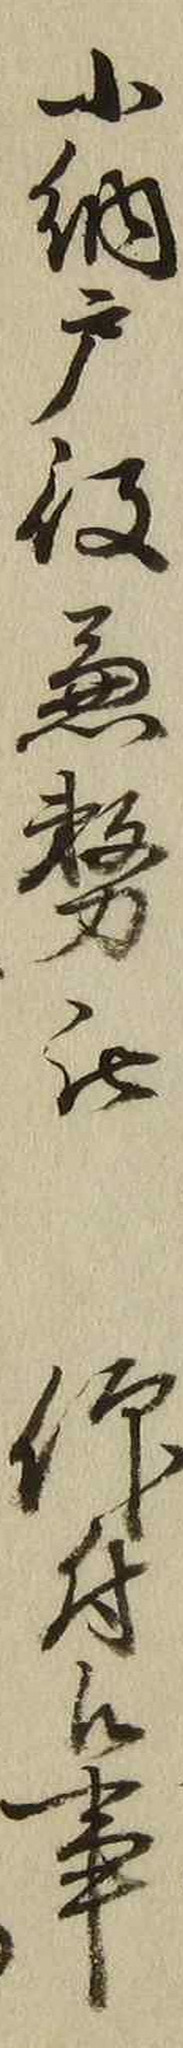小納戸役兼務被仰付候事
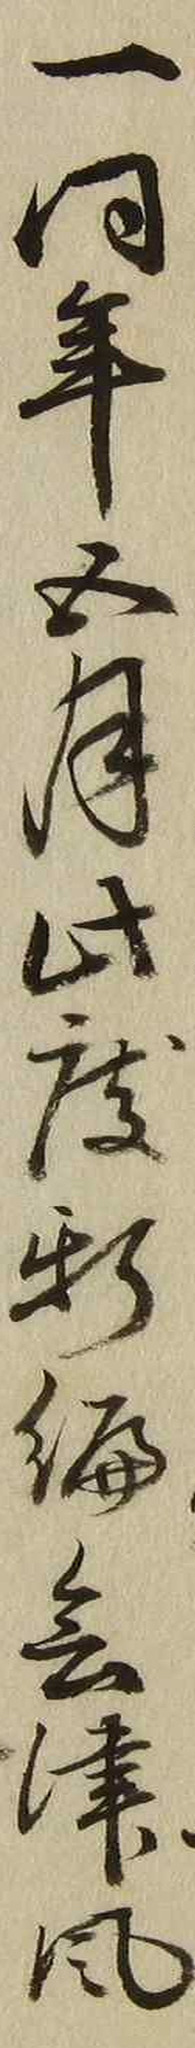一同年五月此度新編会津風
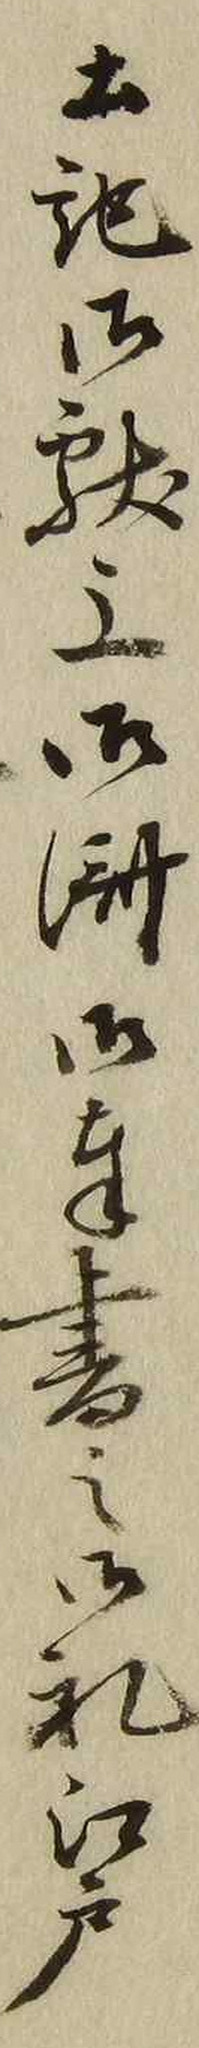土記御献上御済御奉書之御礼江戸
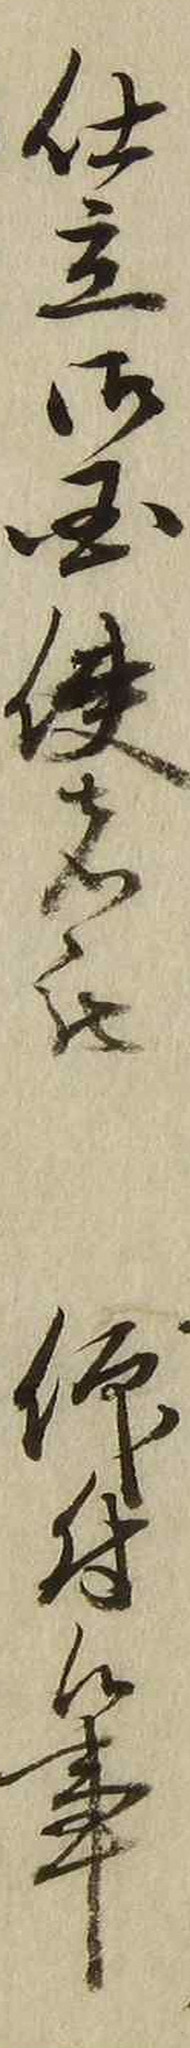仕立御国使者被仰付候事
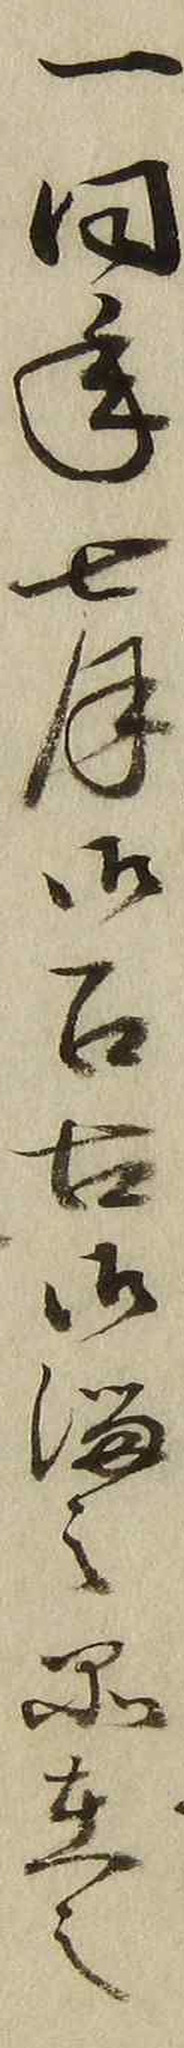一同年七月御召古御溜之品在之
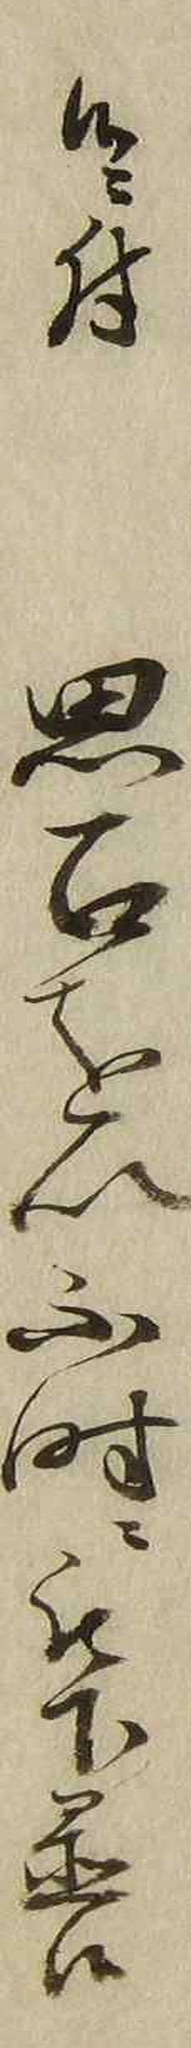候ニ付思召を以不時ニ被下置候
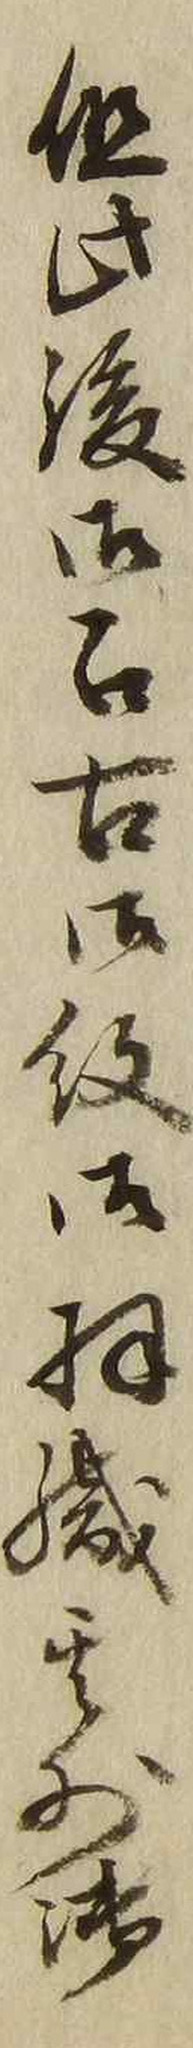但此後御召古御紋御羽織其外御

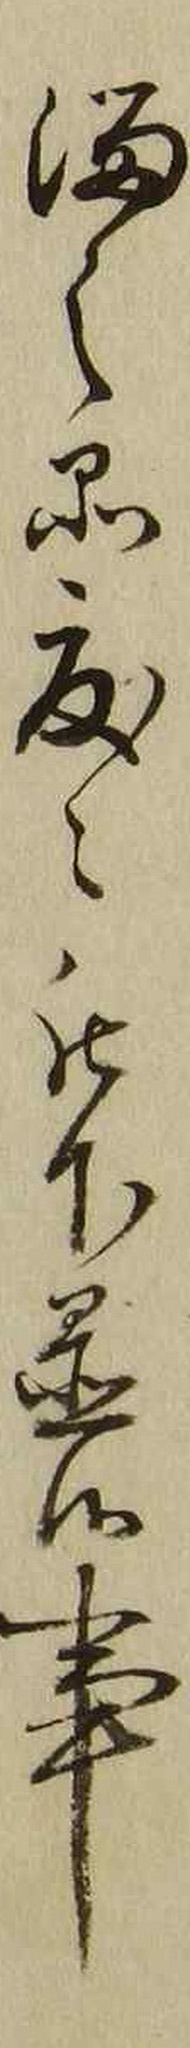溜之品度々被下置候事
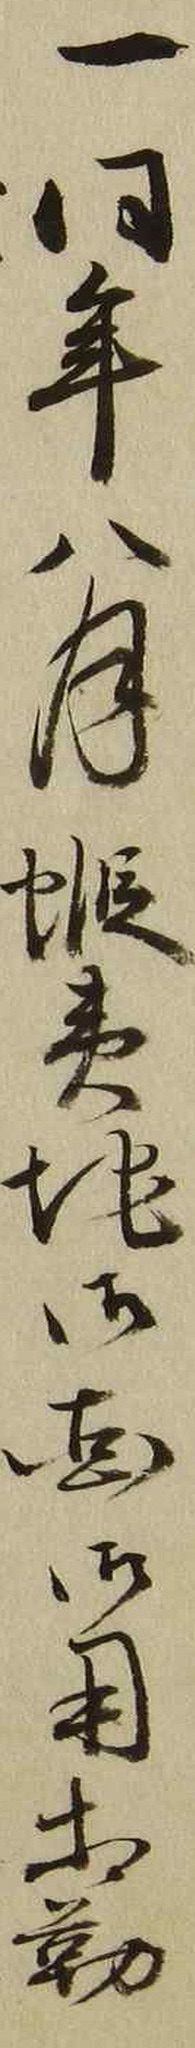一同年八月暇夷地御固御用相勤
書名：諸士系譜　巻之35　は之部3
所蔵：会津若松市立会津図書館
